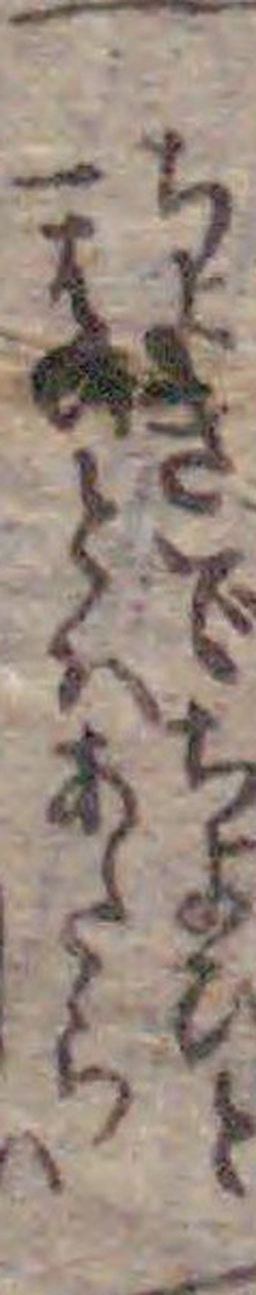一はいとはあたら

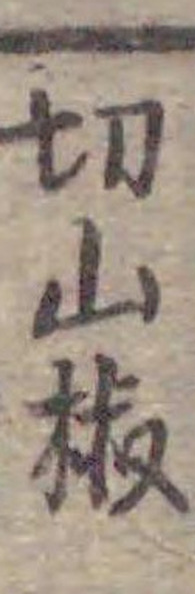切山椒
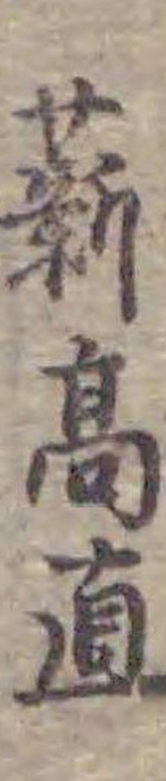薪高直
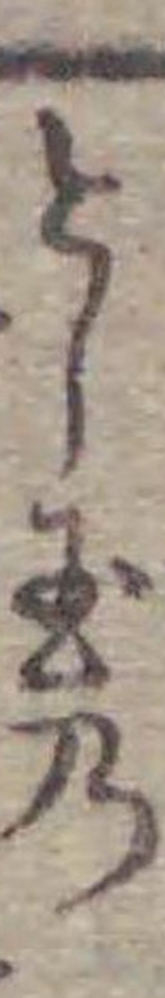とし玉の
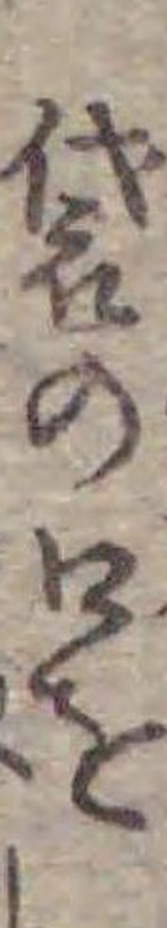袋の口を
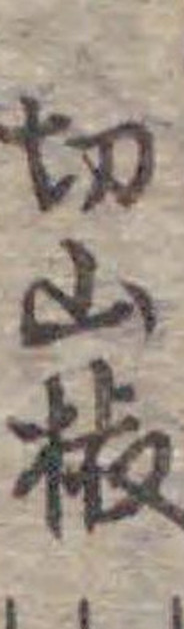切山椒
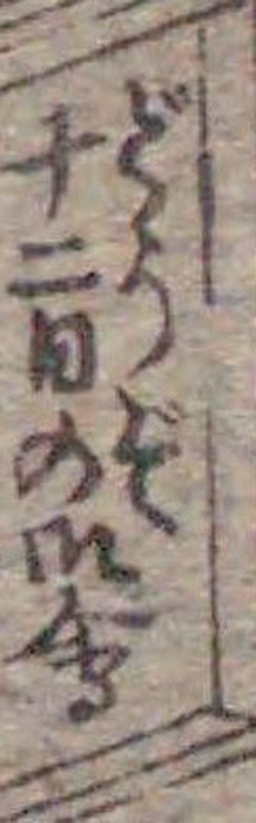十二日の御会
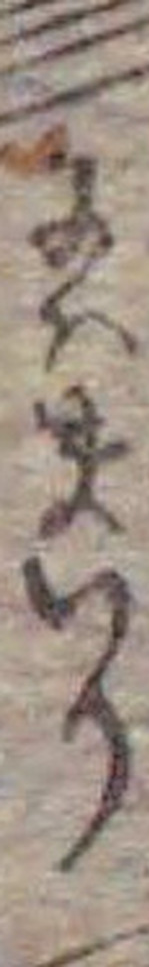にはまいり
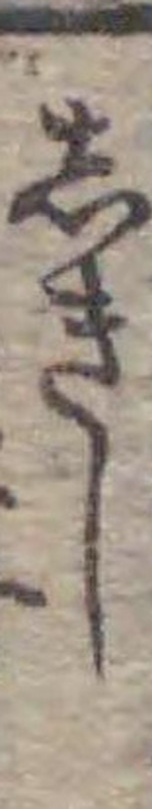しきし
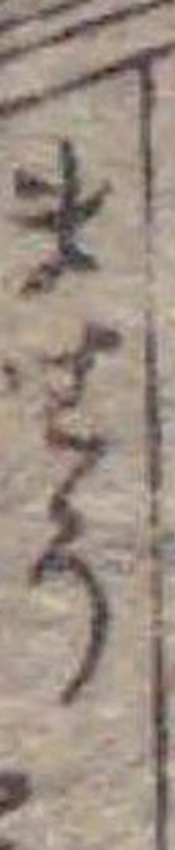ませう
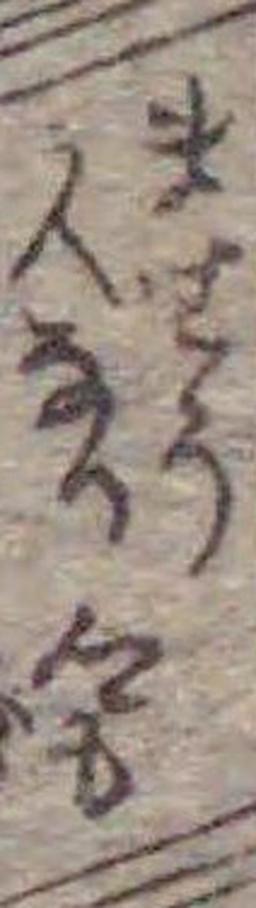人なり卿も
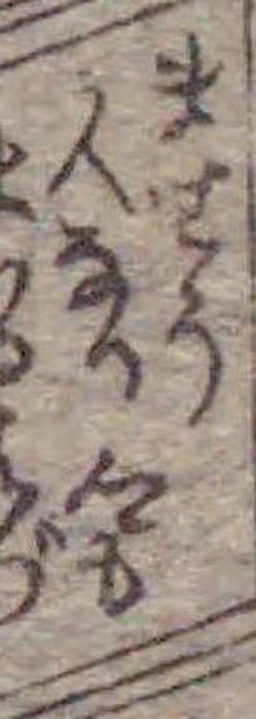人なり卿も
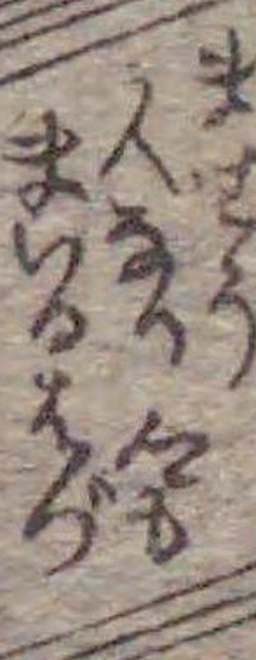まいるはづ
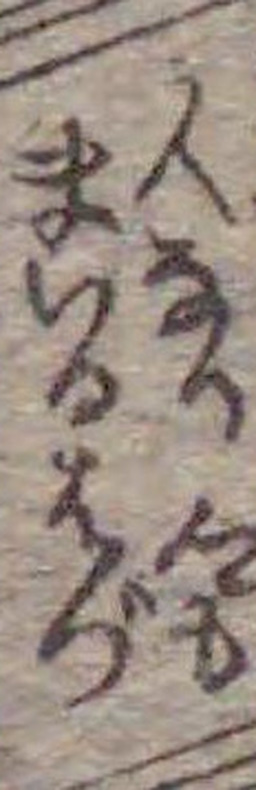まいるはづ
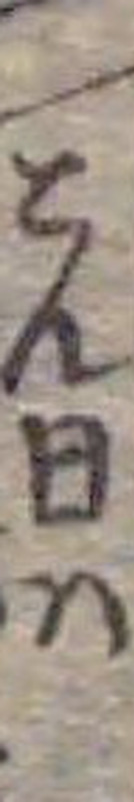こん日は
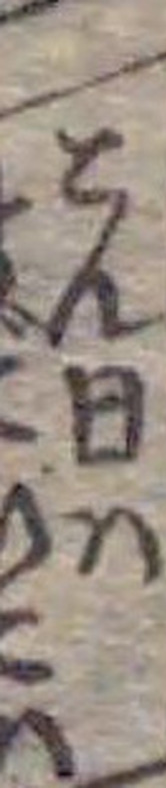こん日は
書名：年始御礼帳 : 3巻
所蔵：国立国会図書館 National Diet Library, JAPAN
